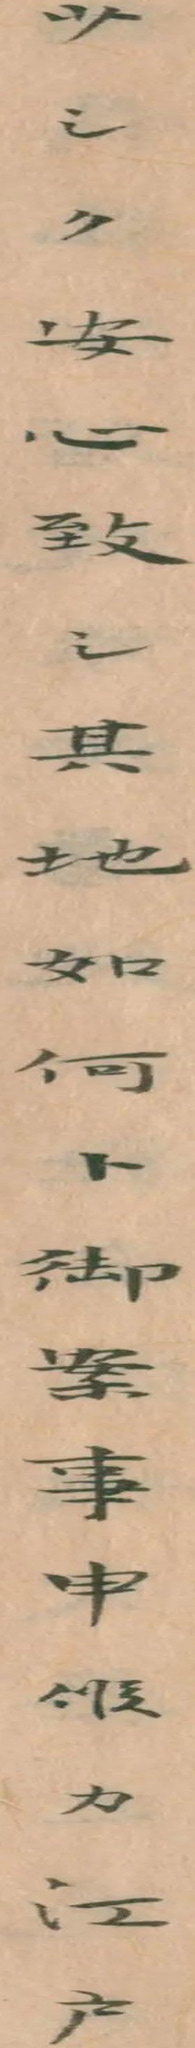少シク安心致シ候其地如何ト御安事候カ江戸
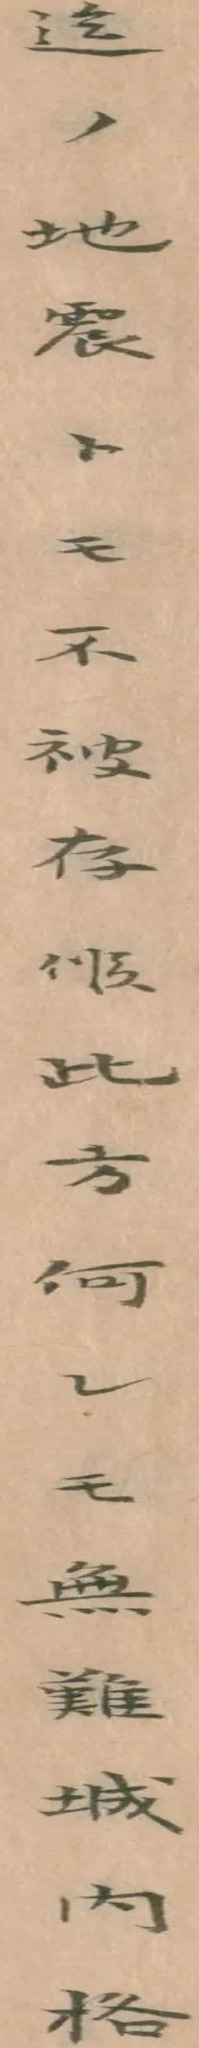迄ノ地震トモ不被存候此方何レモ無難城内格
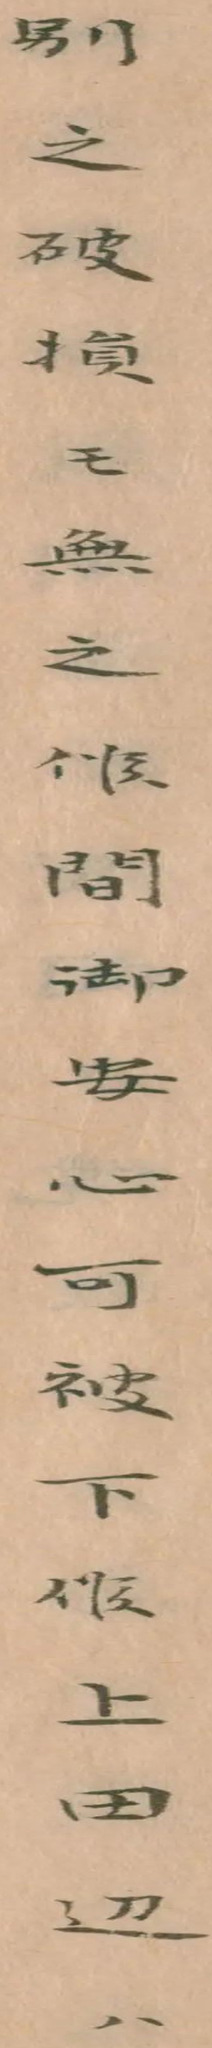別之破損モ無之候間御安心可被下候上田辺ハ
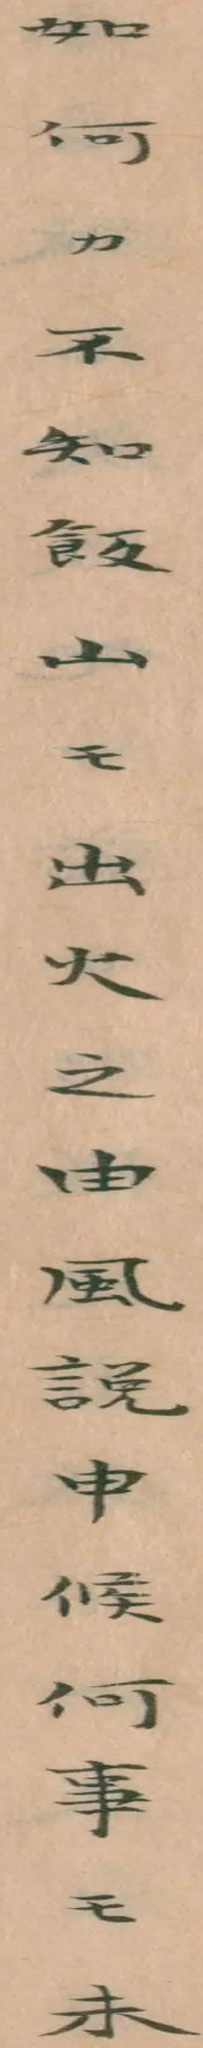如何カ不知飯山モ出火之由風説申候何事モ未
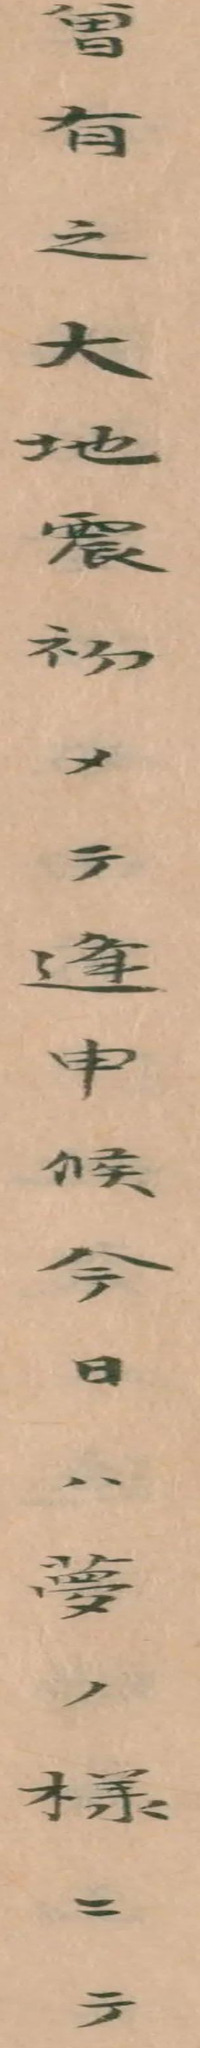曾有之大地震初メテ逢申候今日ハ夢ノ様ニテ
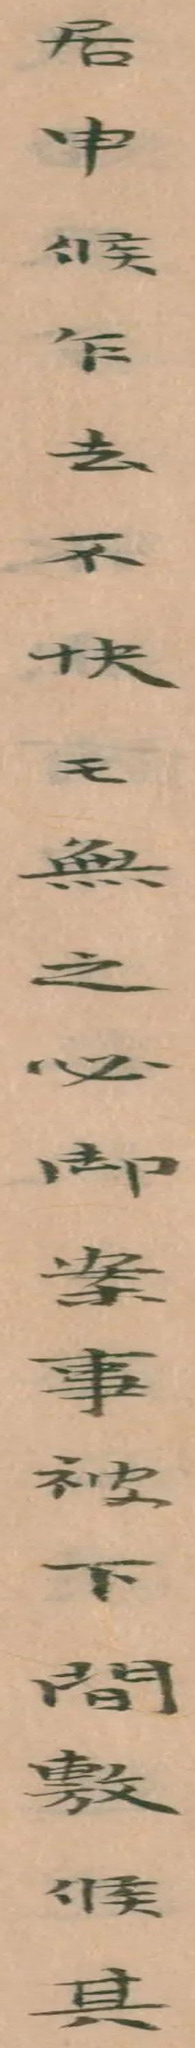居申候乍去不快モ無之必御安事被下間敷候其
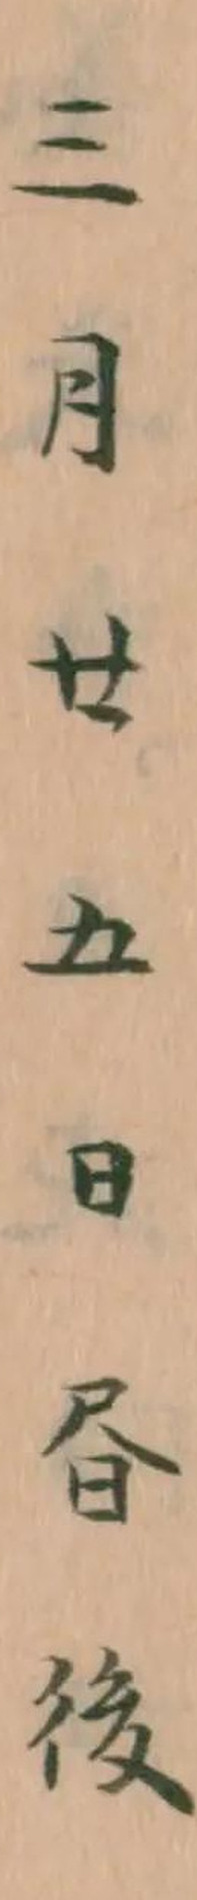三月廿五日昼後
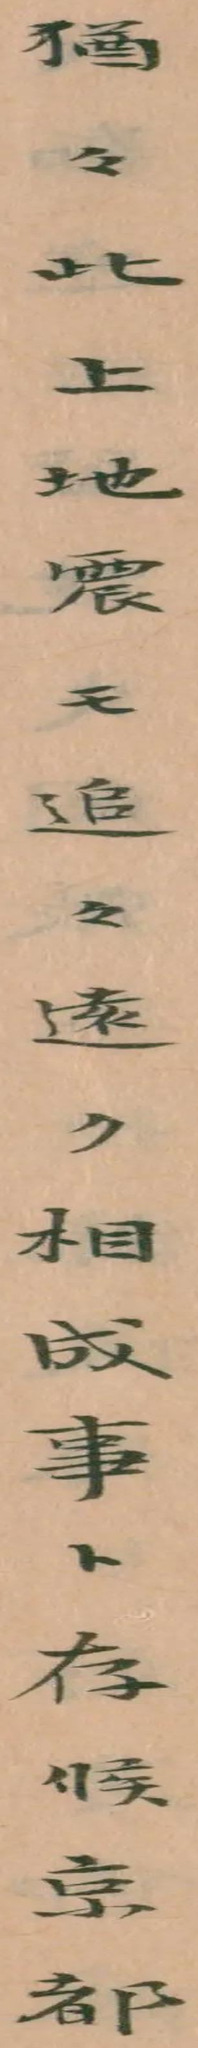猶々此上地震モ追々遠ク相成事ト存候京都
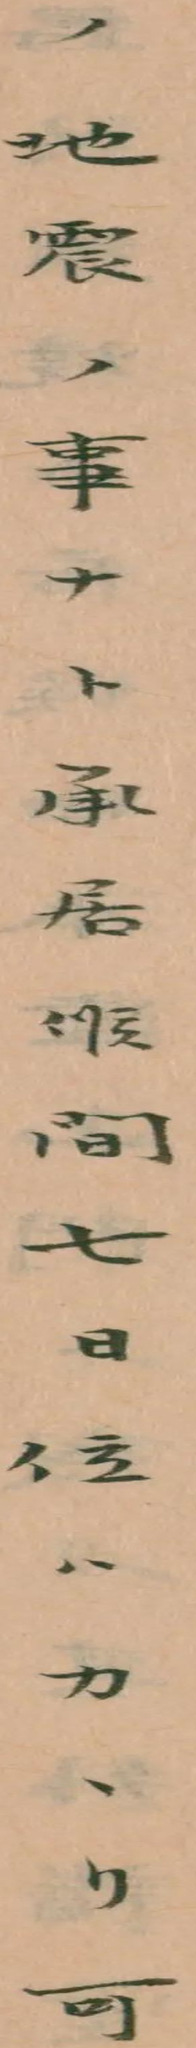ノ地震ノ事ナト承居候間七日位ハかゝり可
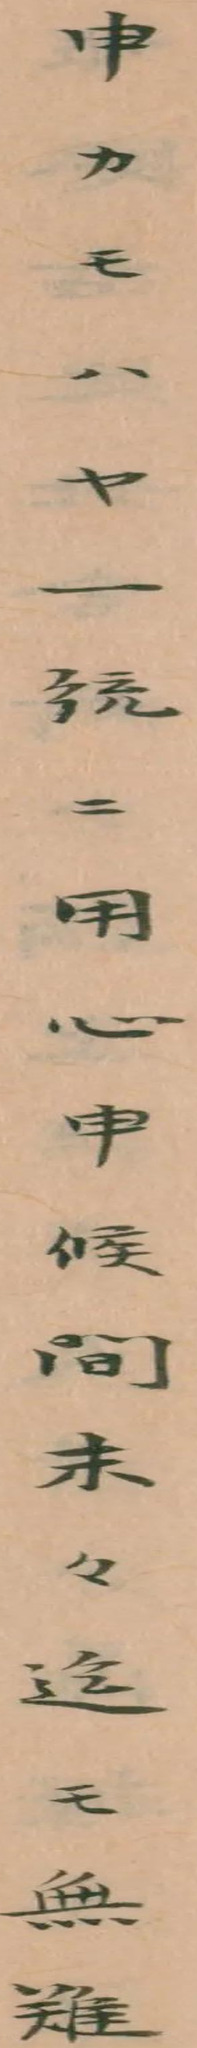申カモハヤ一統二用心申候間未々迄モ無難
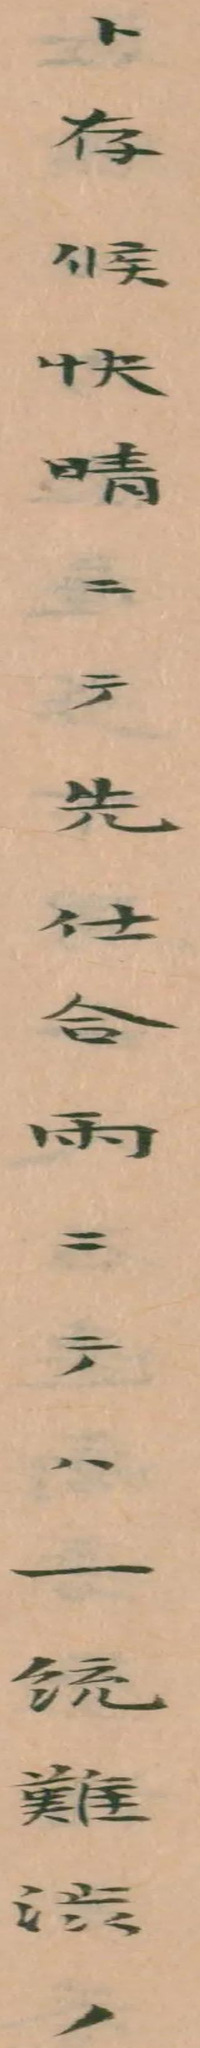ト存候快晴ニテ先仕合雨ニテハ一統難渋ノ
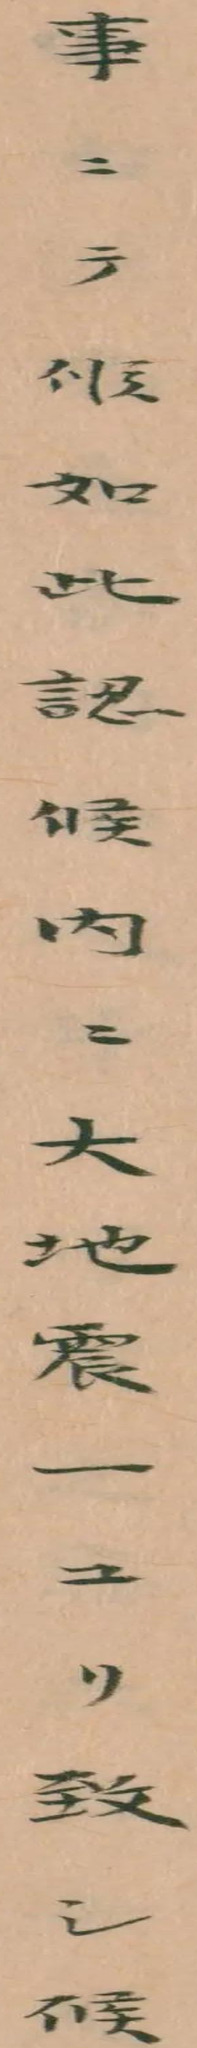事ニテ候如此認候内二大地震一ユリ致シ候
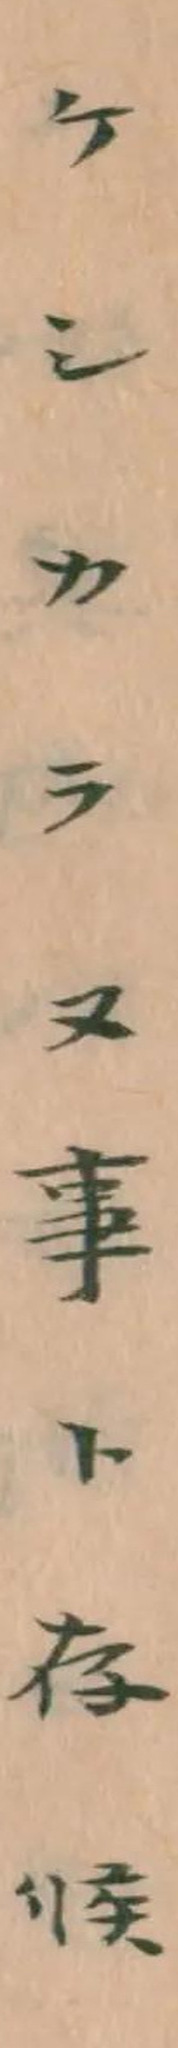ケシカラヌ事ト存候
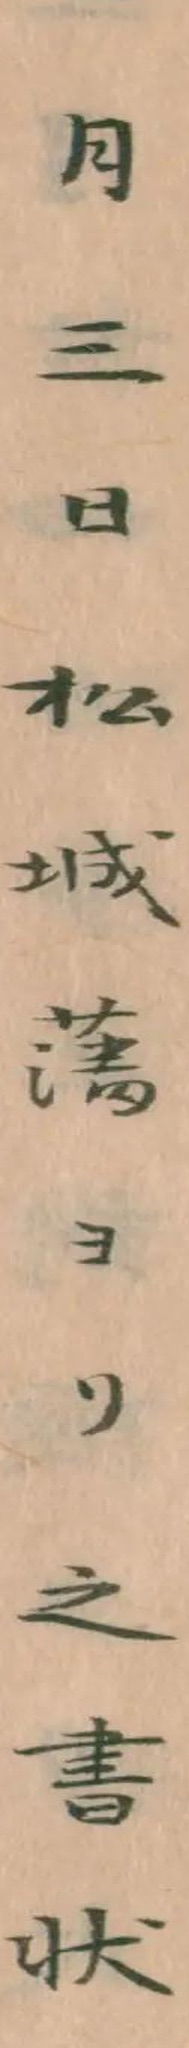四月三日松代藩ヨリ之書状
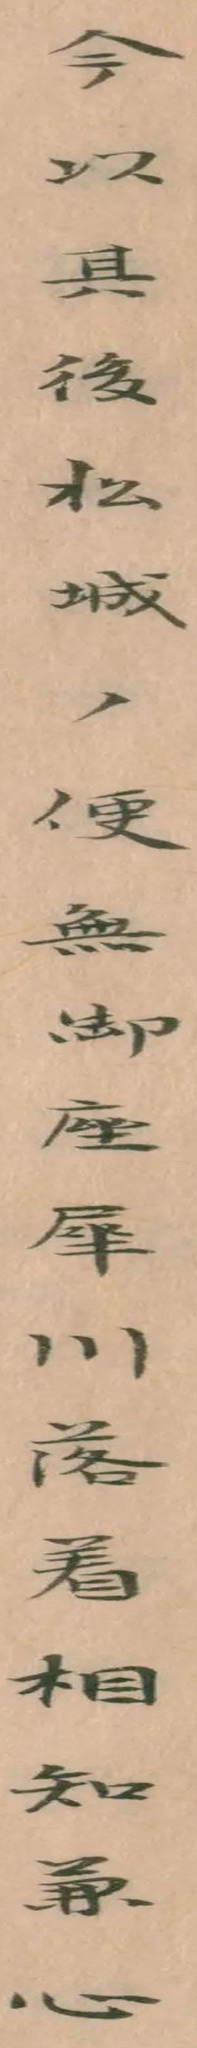今以其後松城ノ便無御座犀川落着相知兼心
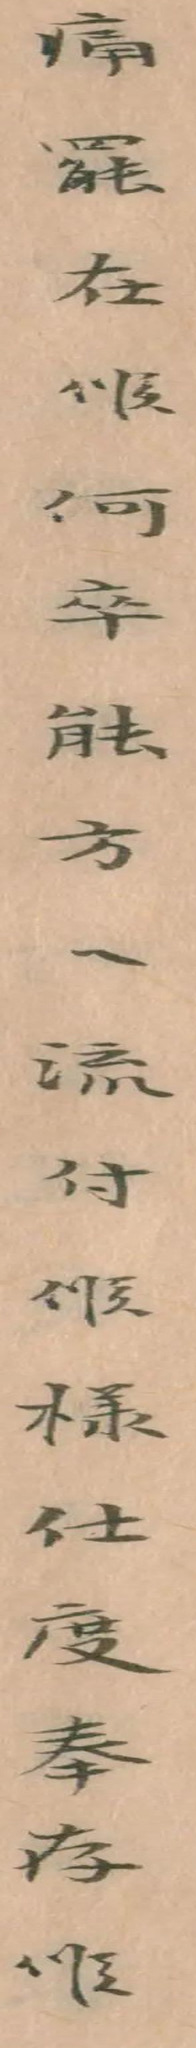痛罷在候何卒能方へ流付候様仕度奉存候
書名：地災撮要. 巻1(噴火山・地震ノ部)
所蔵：国立国会図書館 National Diet Library, JAPAN
